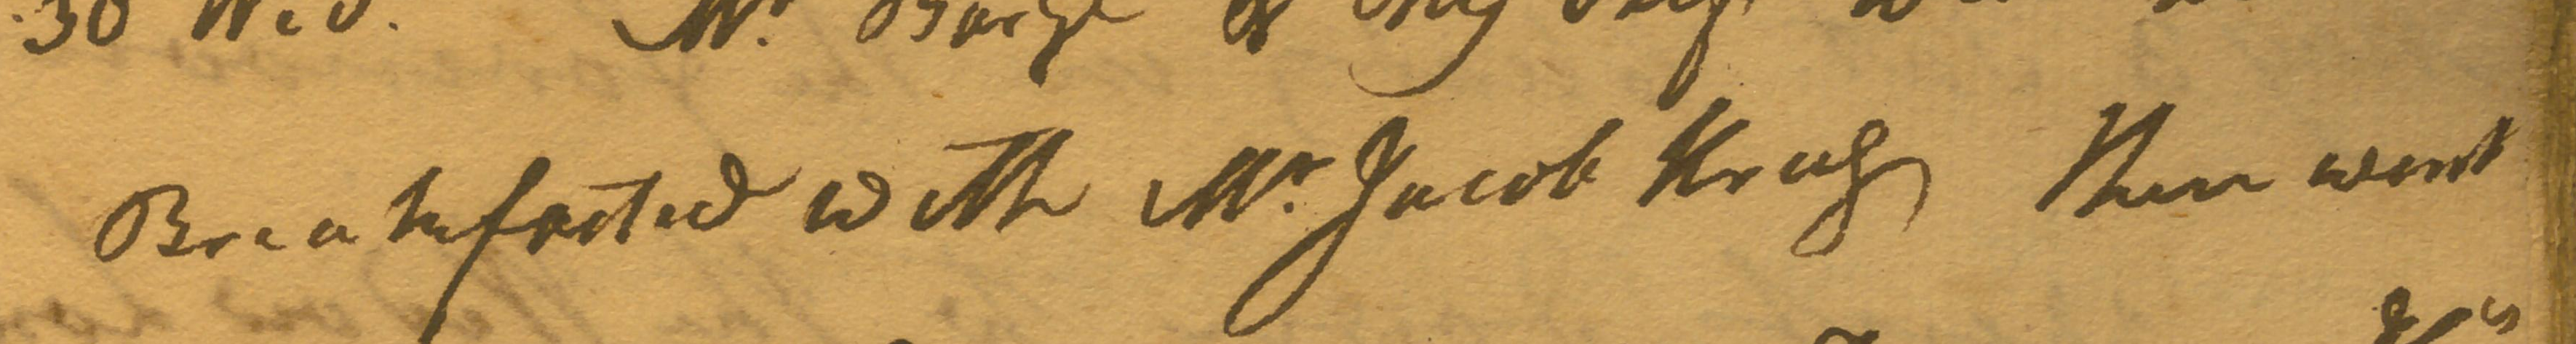Breakfasted with M^r. Jacob Krug then went
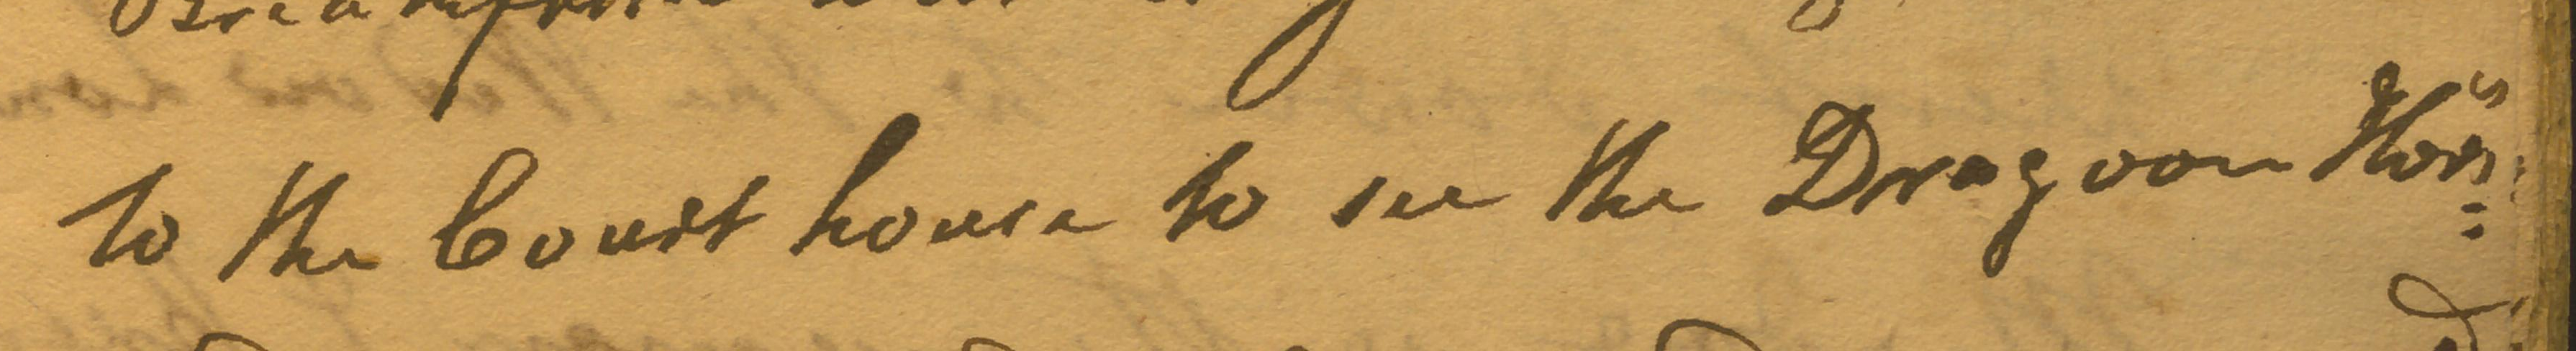to the Court house to see the Dragoon Hors^es
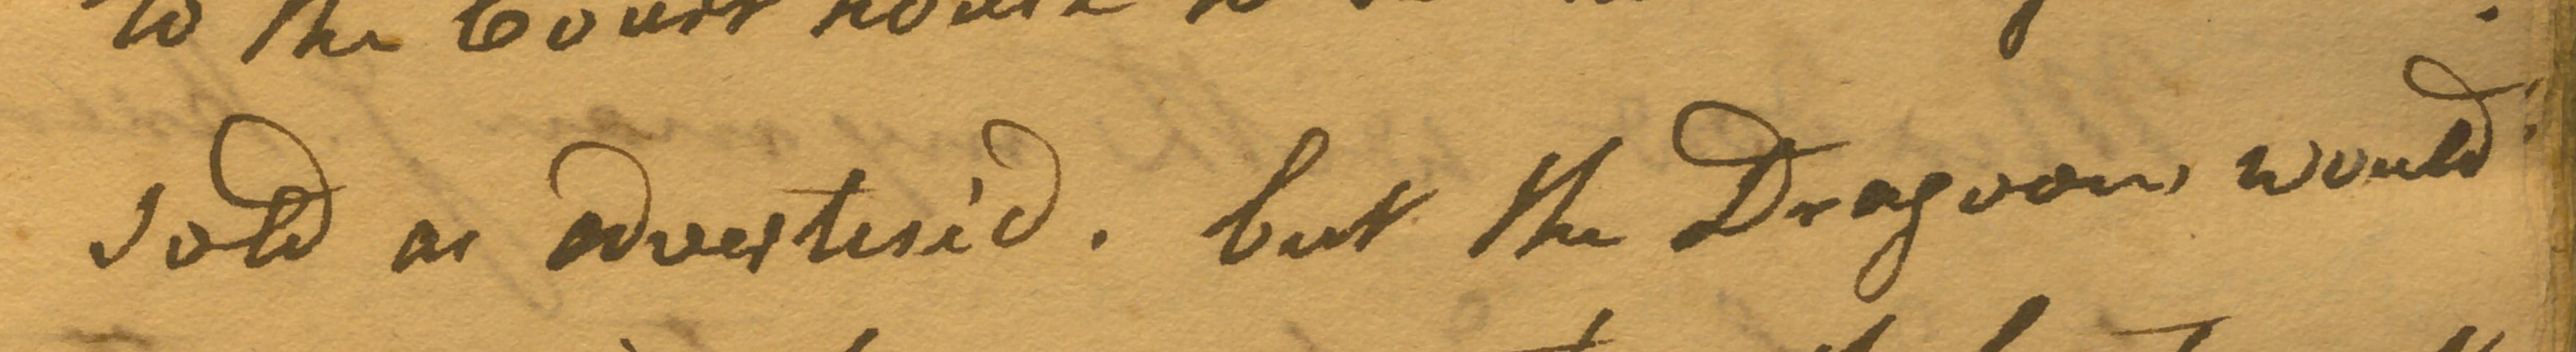sold as advestised. but the Dragoons would
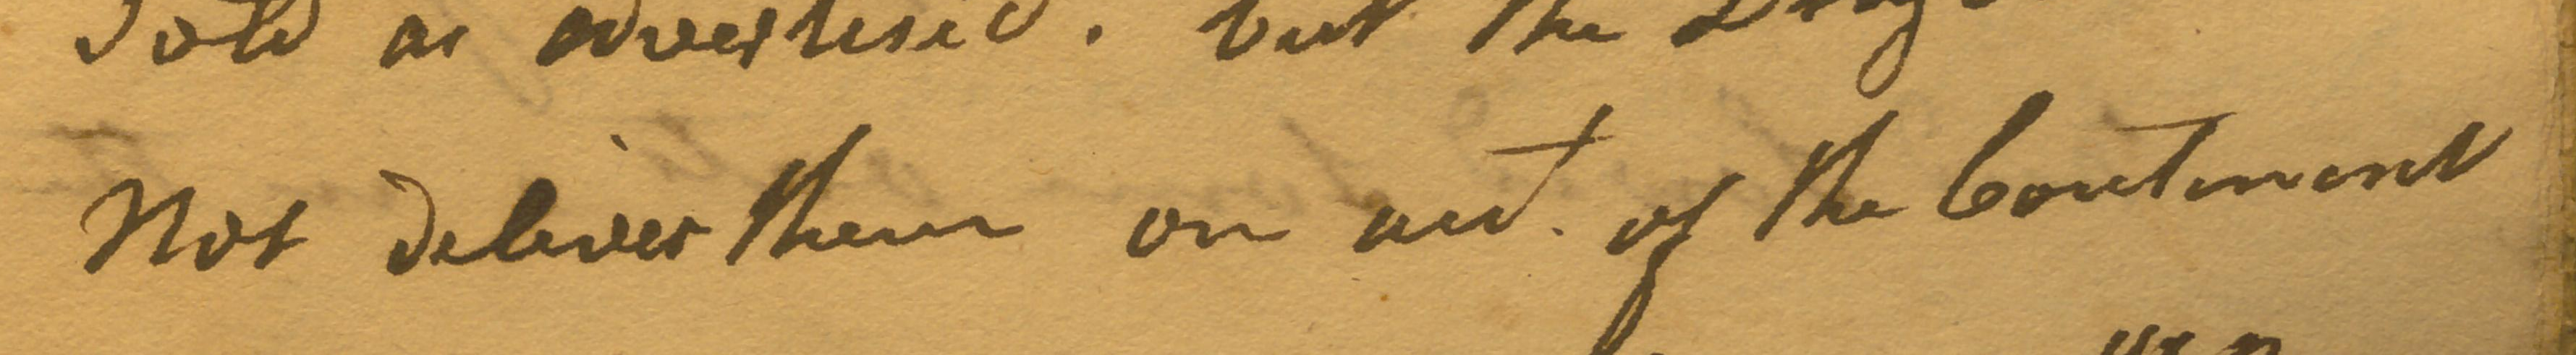Not deliver them on acc^t. of the Continent
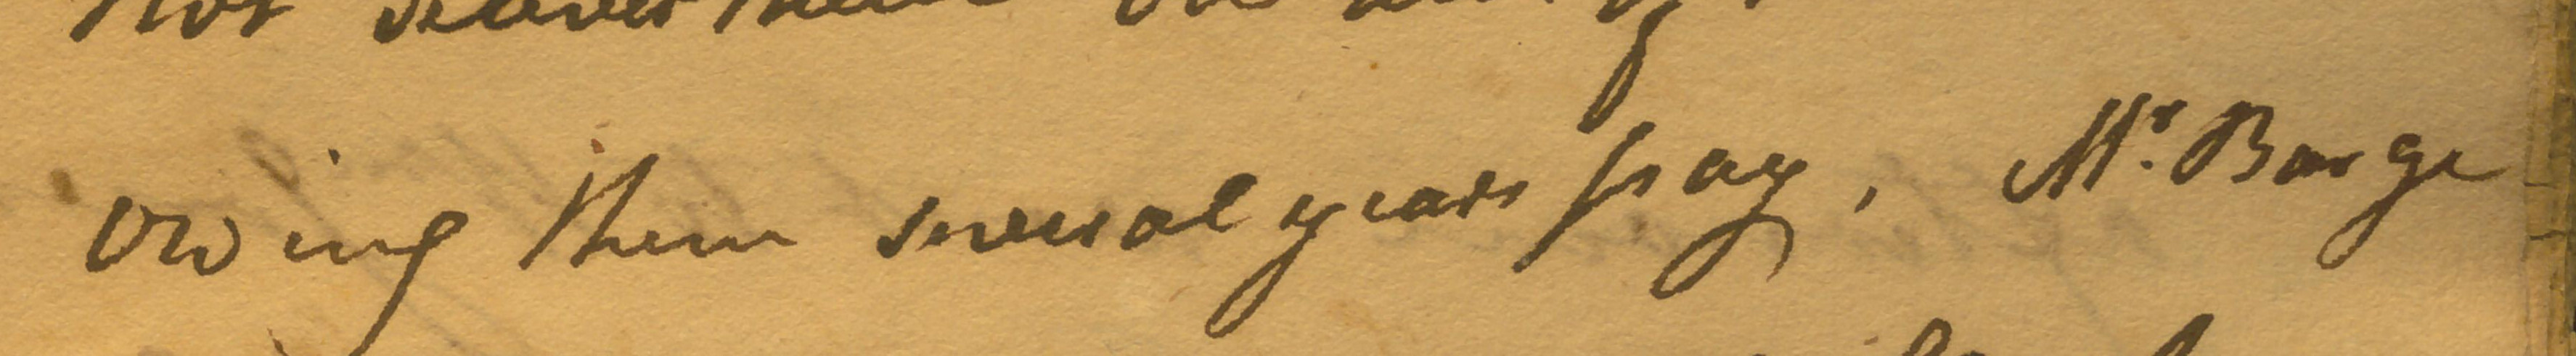owing them several years pay, M^r. Barge
